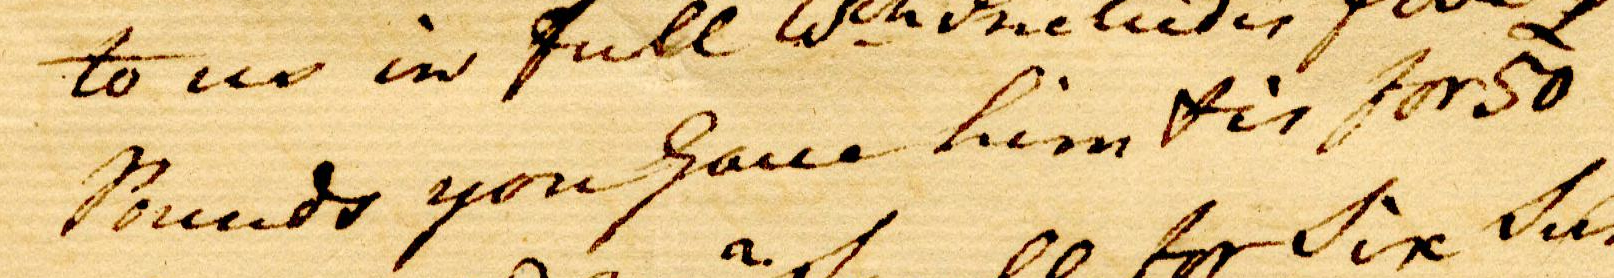Pounds you gave him & is for 50 ^£
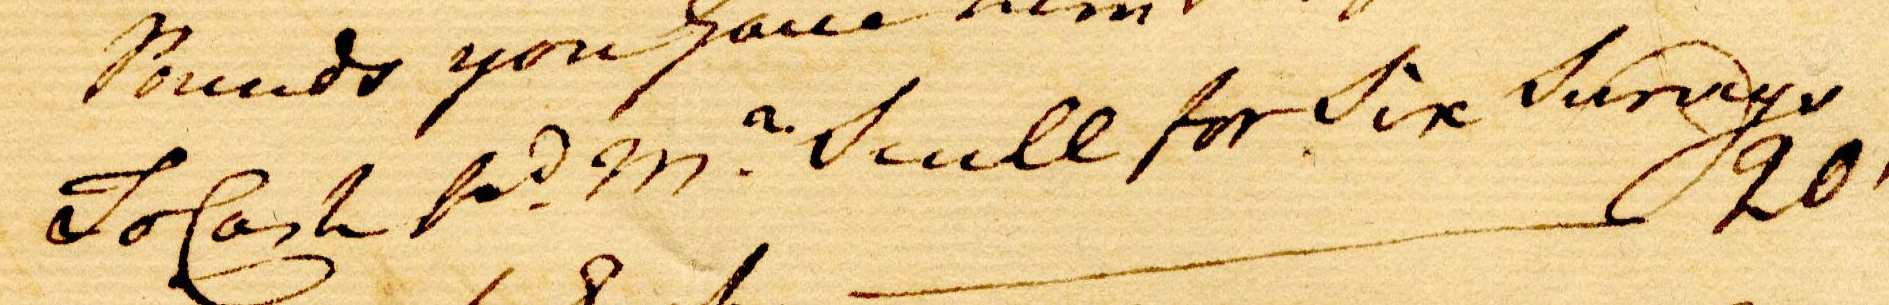To Cash p^d. M^r. Scull for six surveys
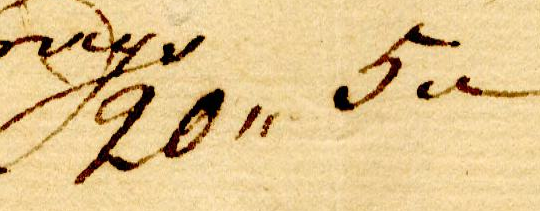20.. 5-
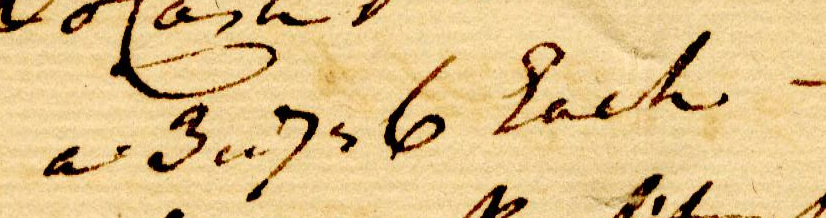a 3.. 7s 6 Each-
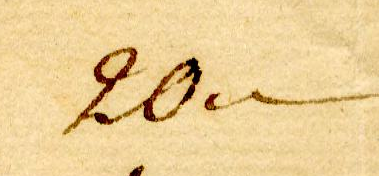20-
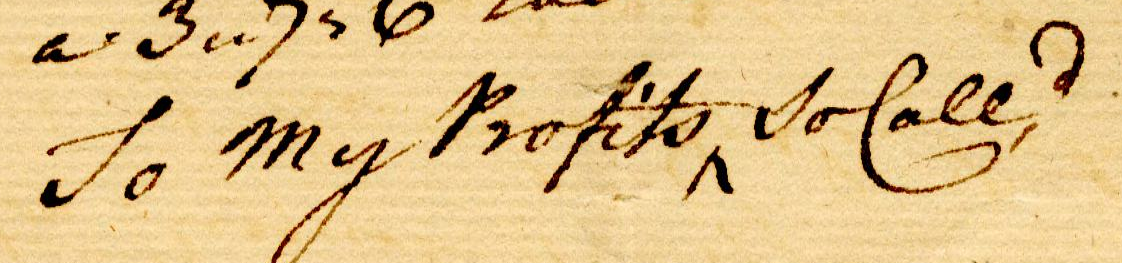To my Profits ^ so Call'^d
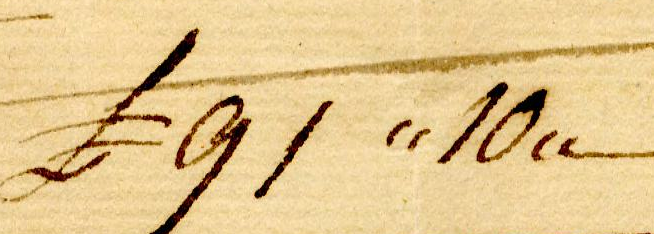£91.. 10..-
